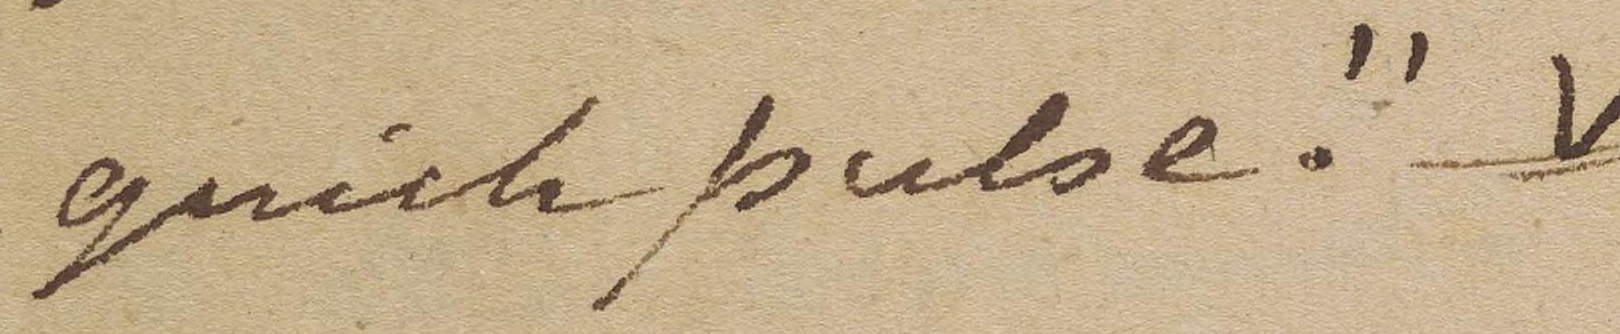quick pulse.
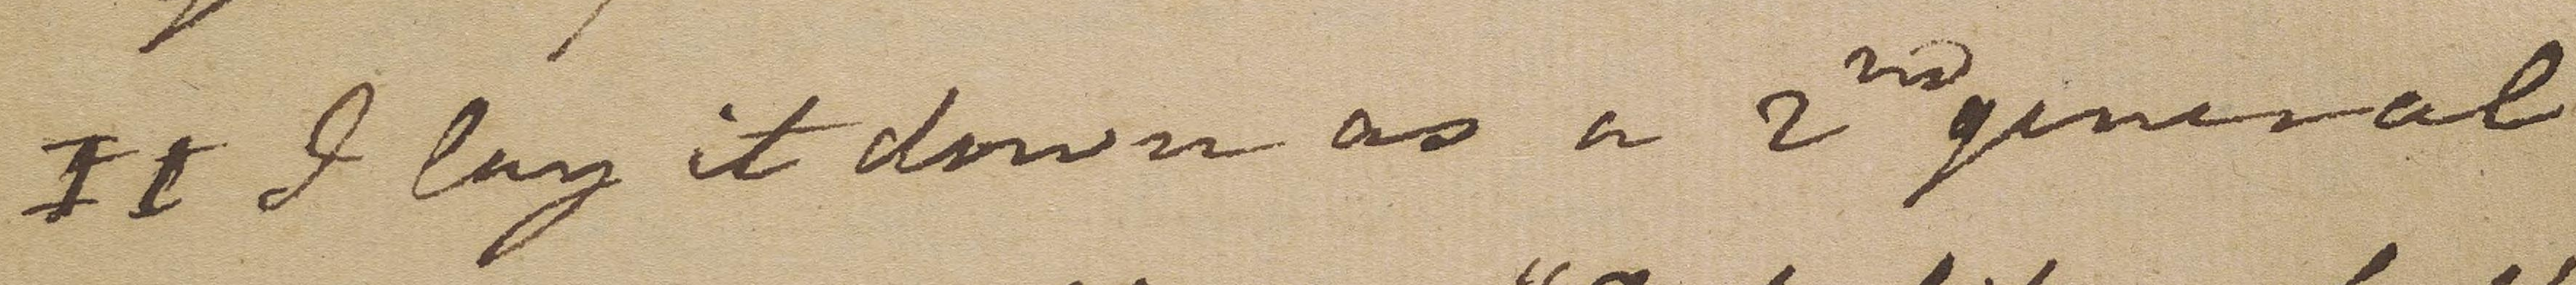I I lay it down as a 2nd general
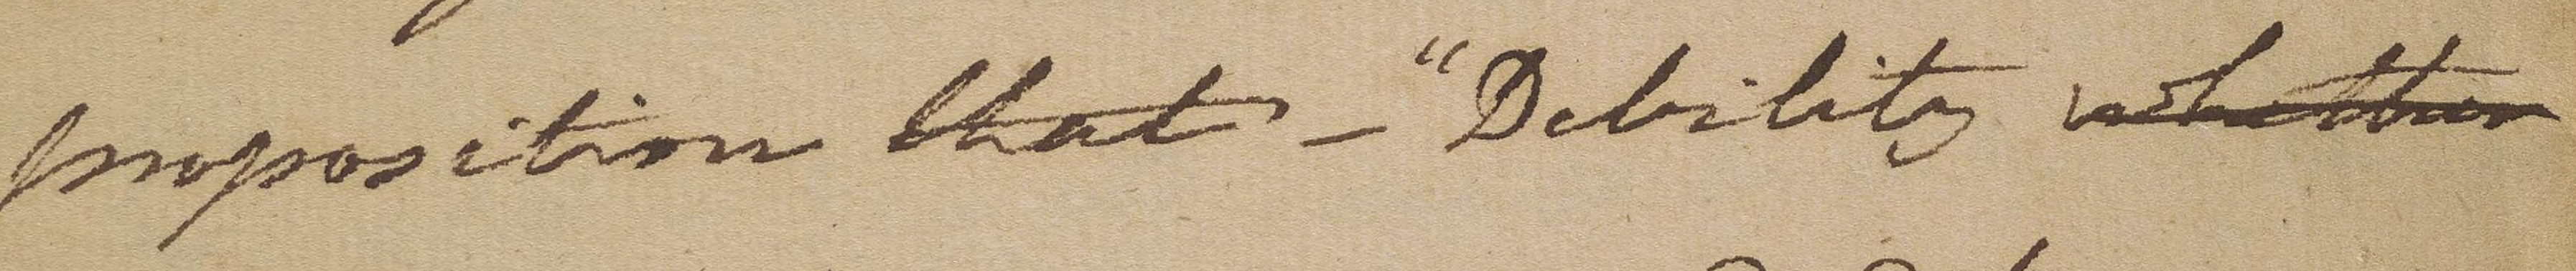proposition that "Debility [whether]
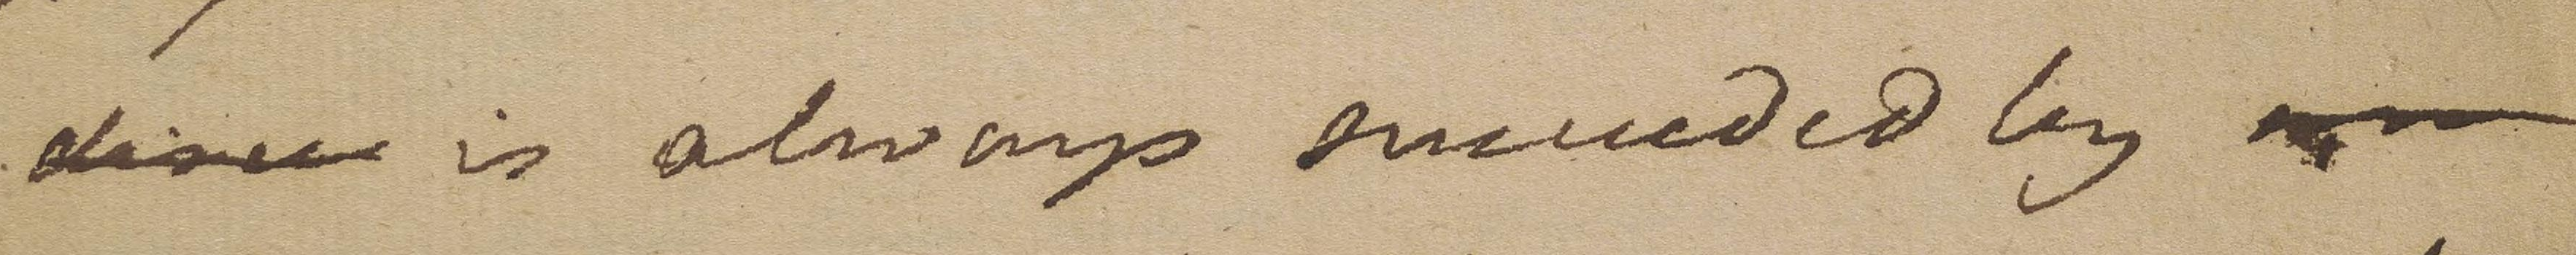[direc] is always succeeded by
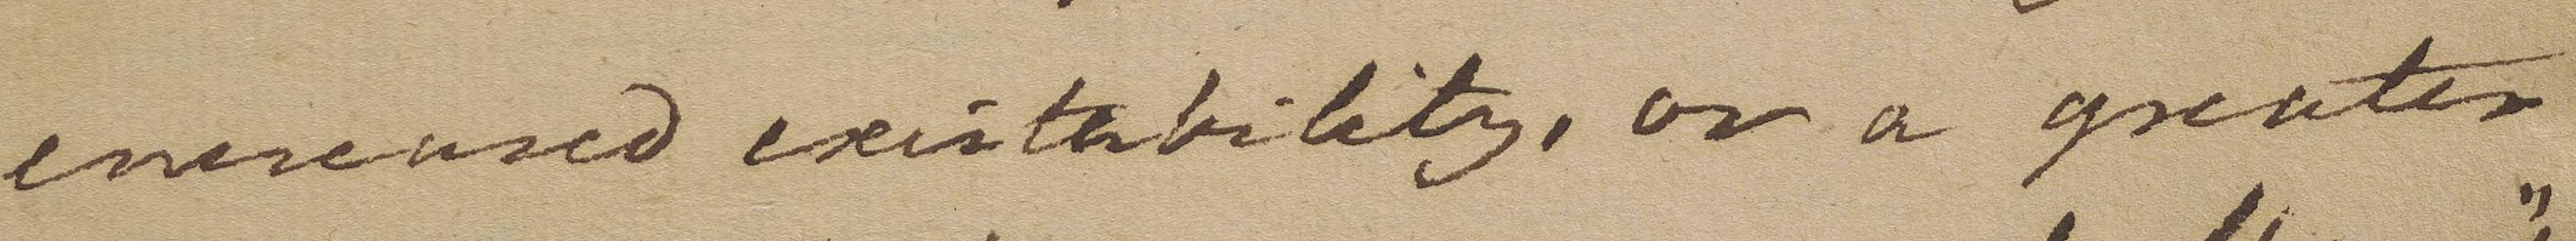increased excitability, or a greater
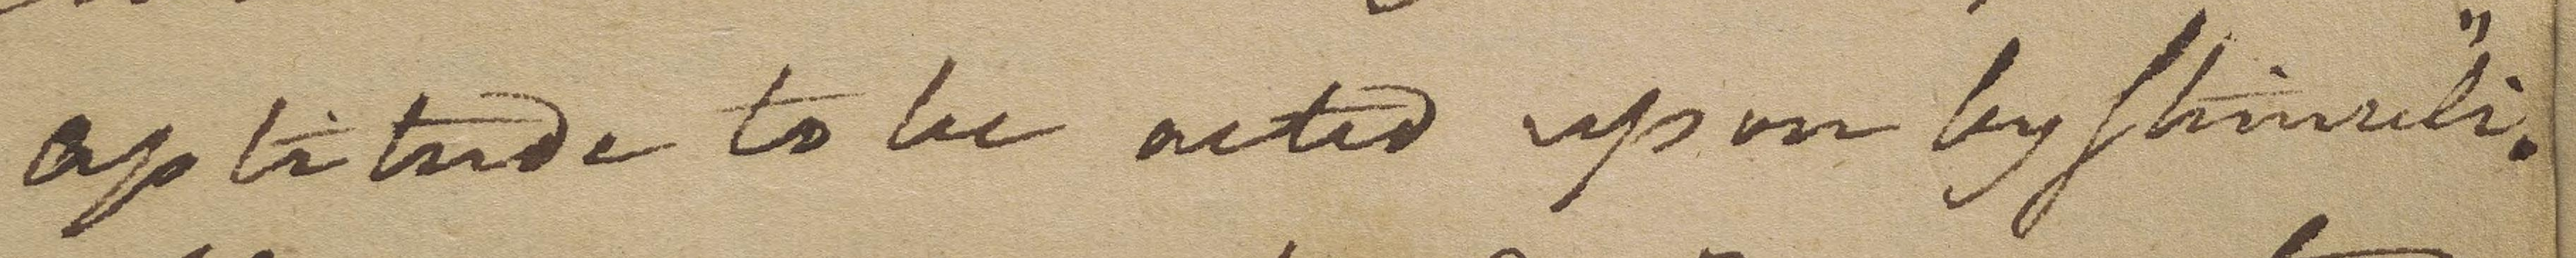aptitude to be acted upon by stimuli."
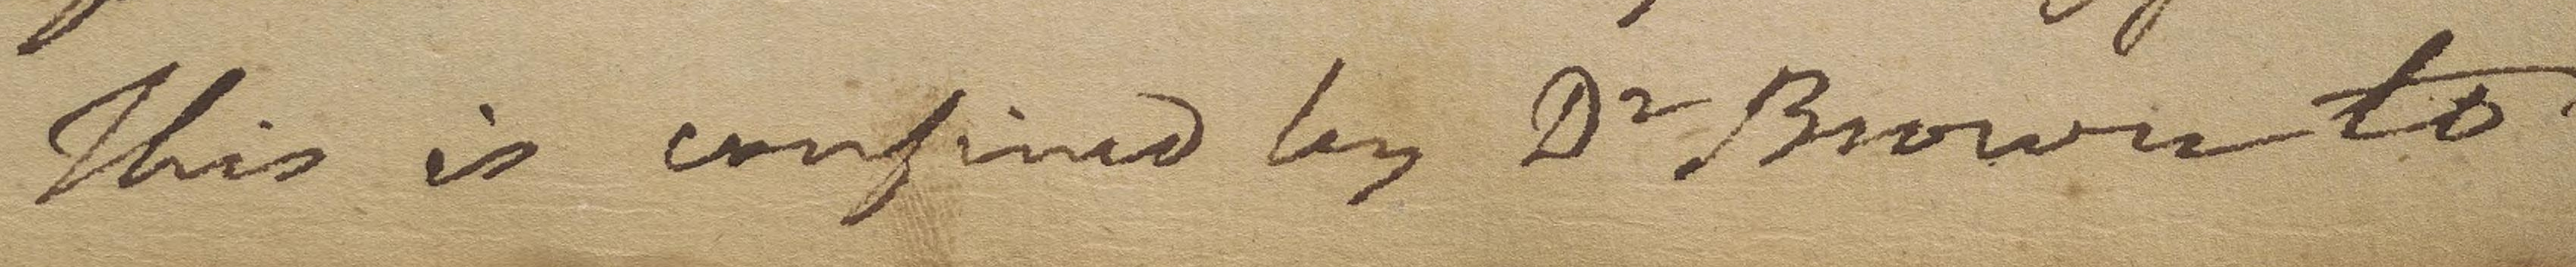This is confined by D^r Brown to
